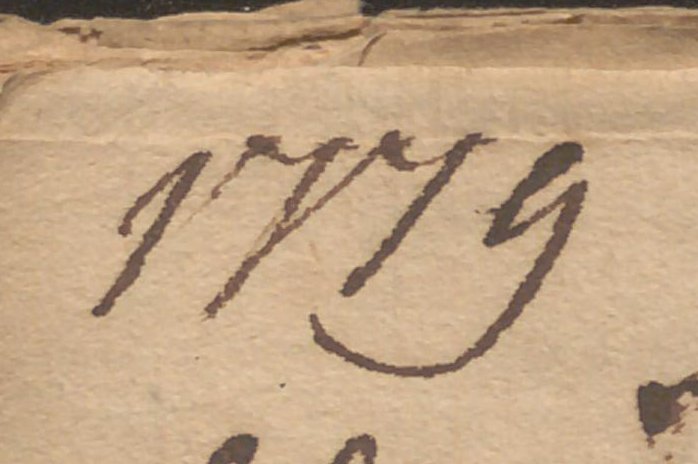1779
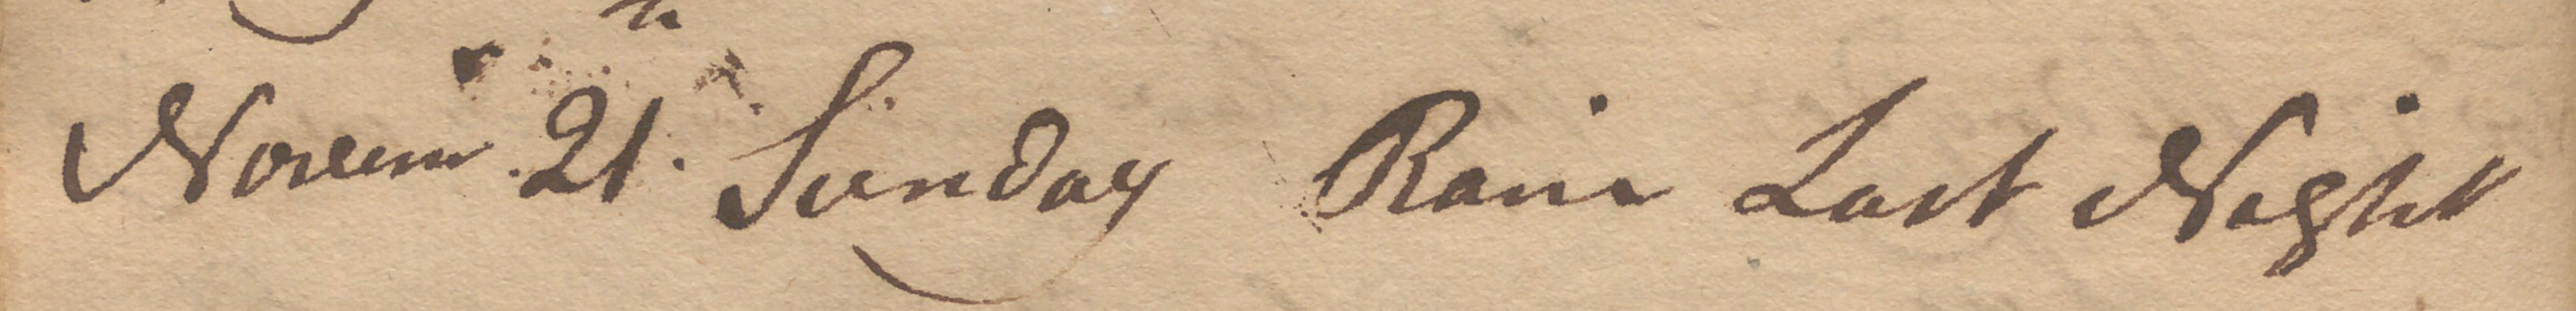Novem^r. 21^st. Sunday Rain Last Night
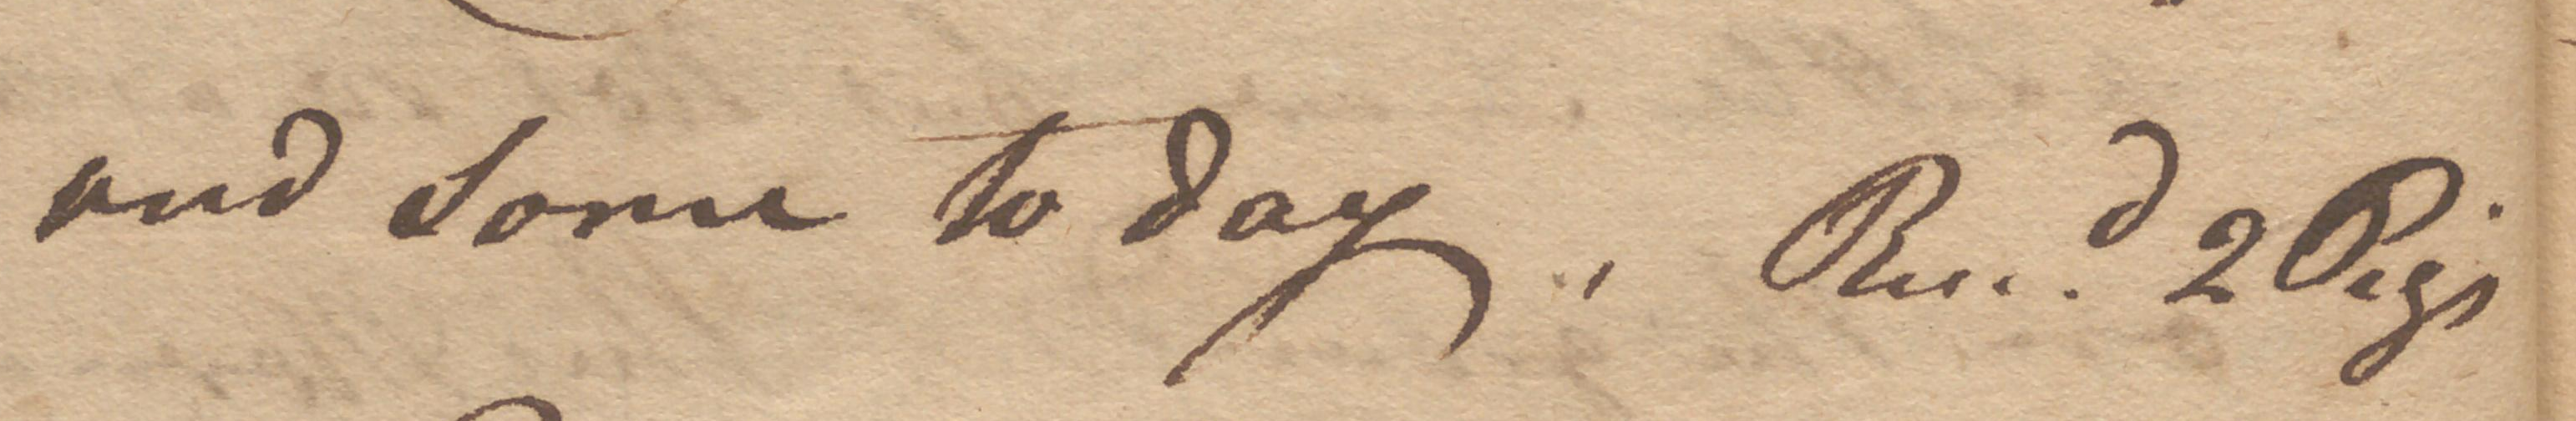and some to day, Rec^d 2 Pigs
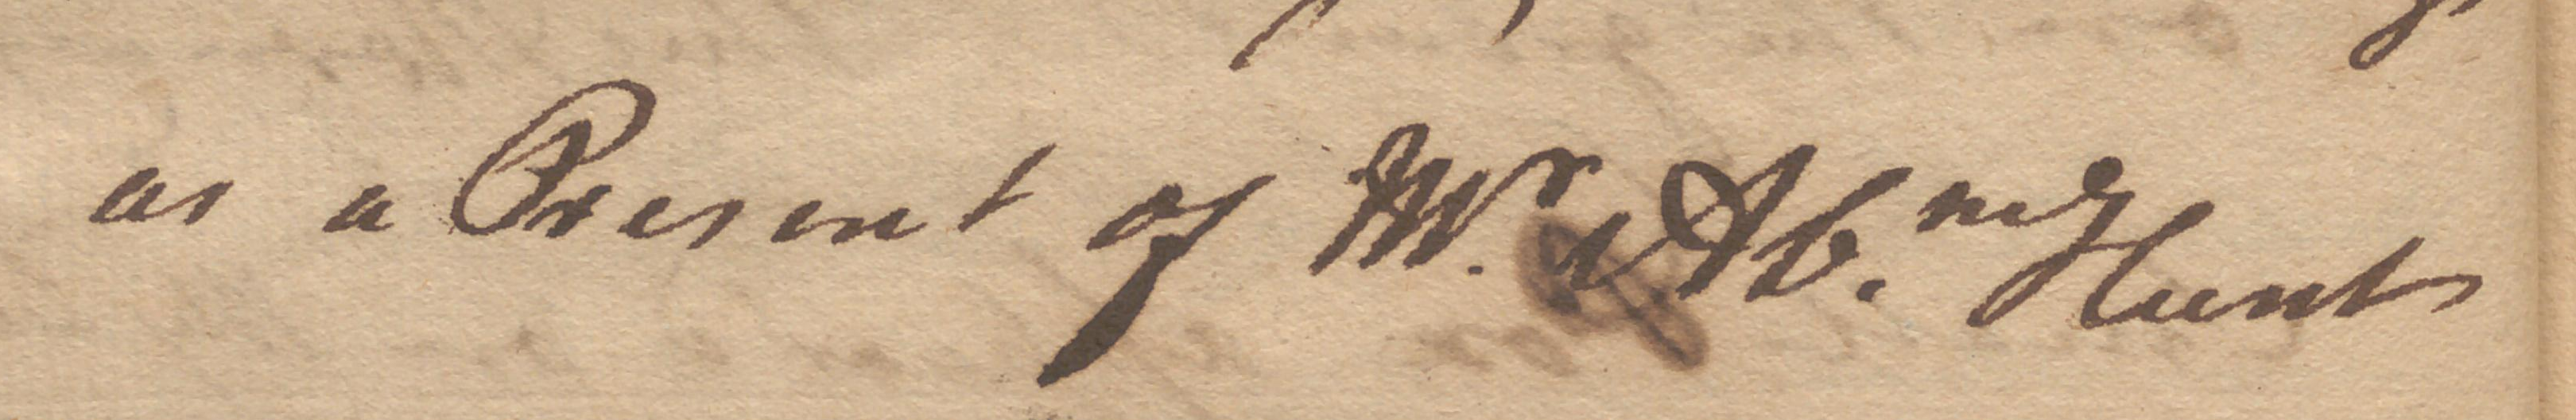as a Present of M^r. Ab^m. Hunt
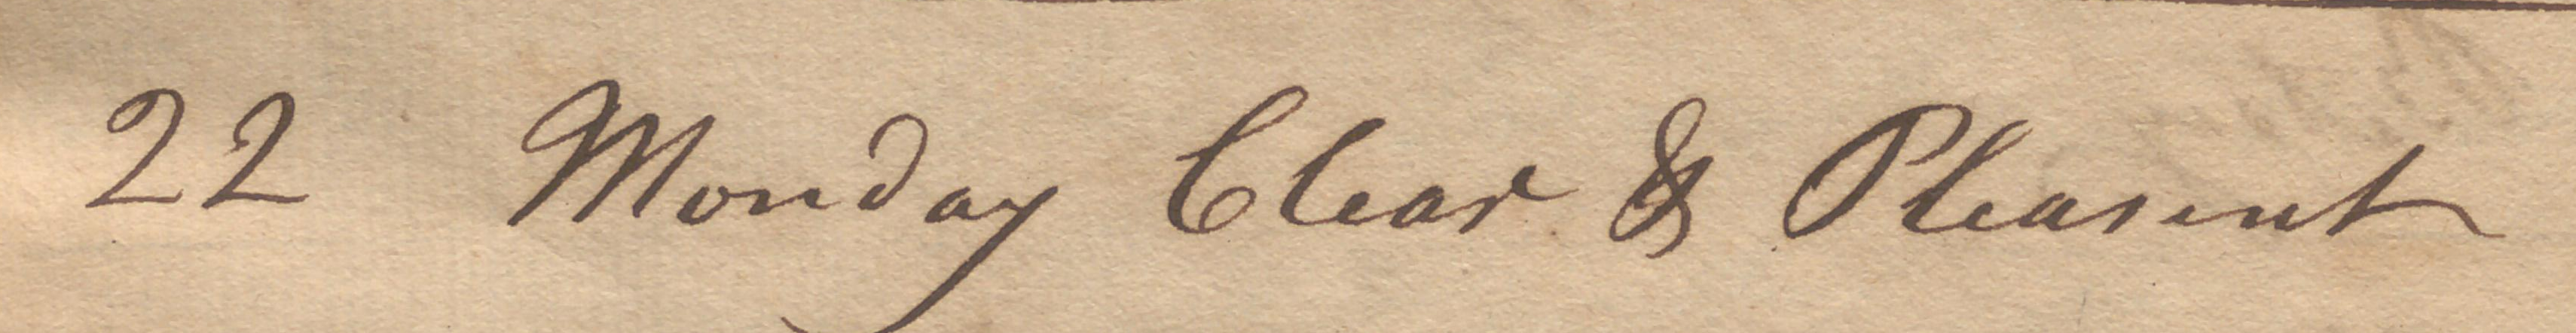22 Monday Clear & Pleasent
